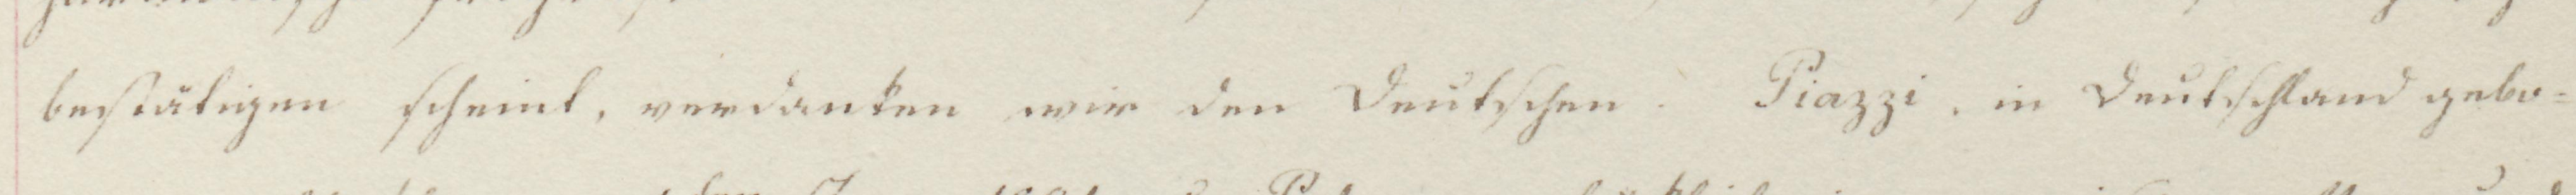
bestätigen scheint, verdanken wir den Deutschen. Piazzi, in Deutschland gebo-
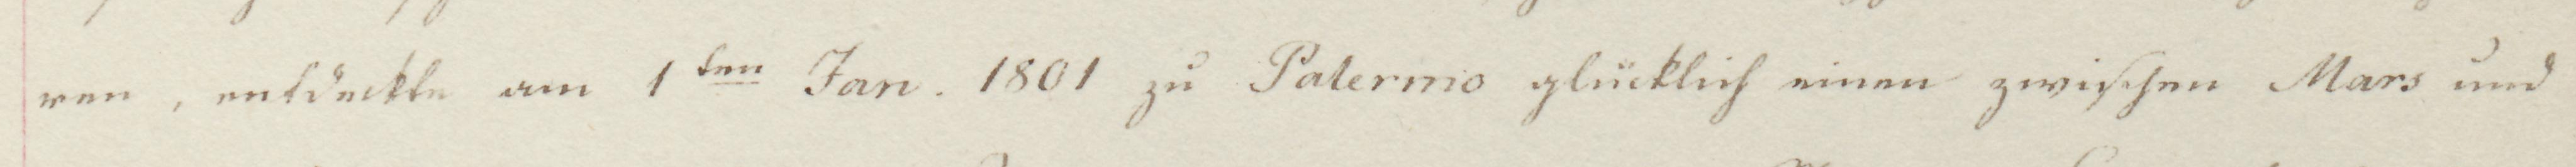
ren, entdeckte am 1ten Jan. 1801 zu Palermo glücklich einen zwischen Mars und
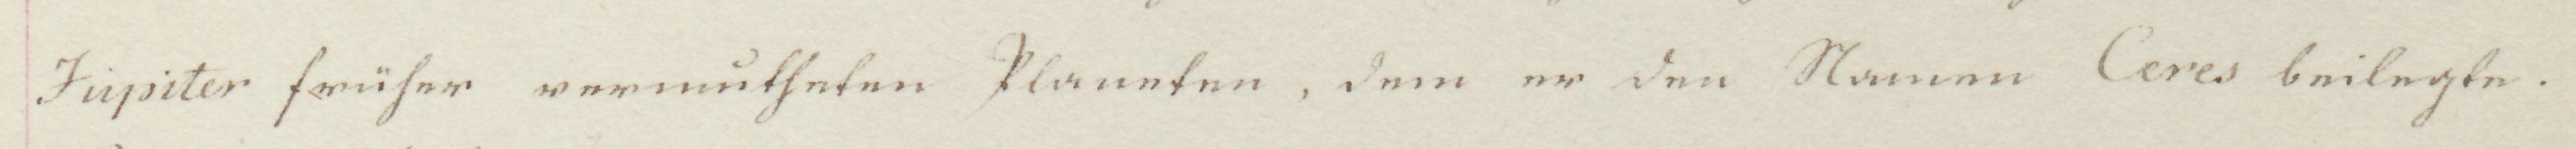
Jupiter früher vermutheten Planeten, dem er den Namen Ceres beilegte.
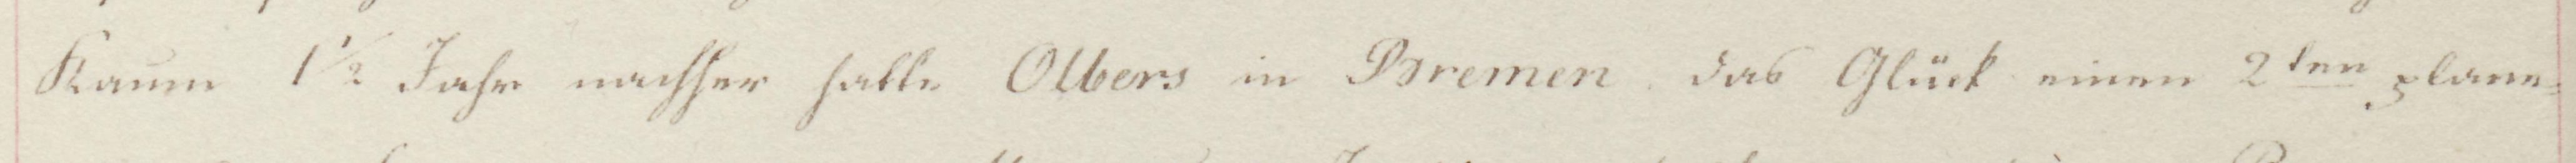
Kaum 1½ Jahre nachher hatte Olbers in Bremen das Glück einen 2ten plane-
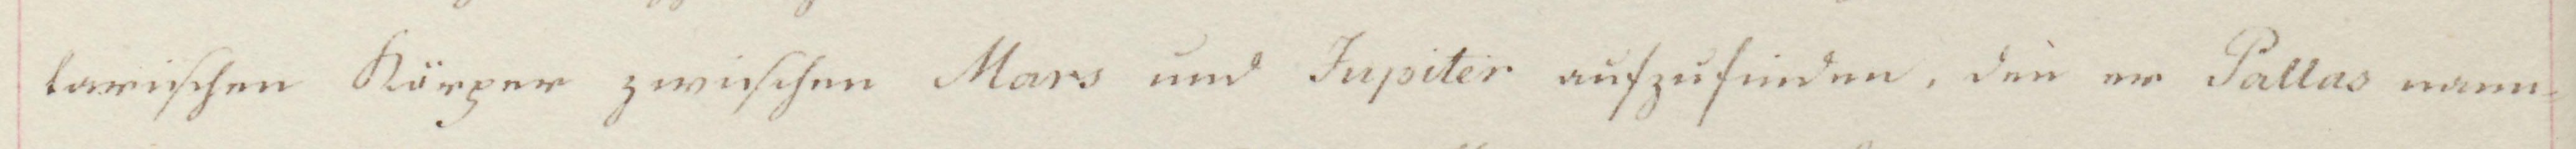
tarischen Körper zwischen Mars und Jupiter aufzufinden, den er Pallas nann-
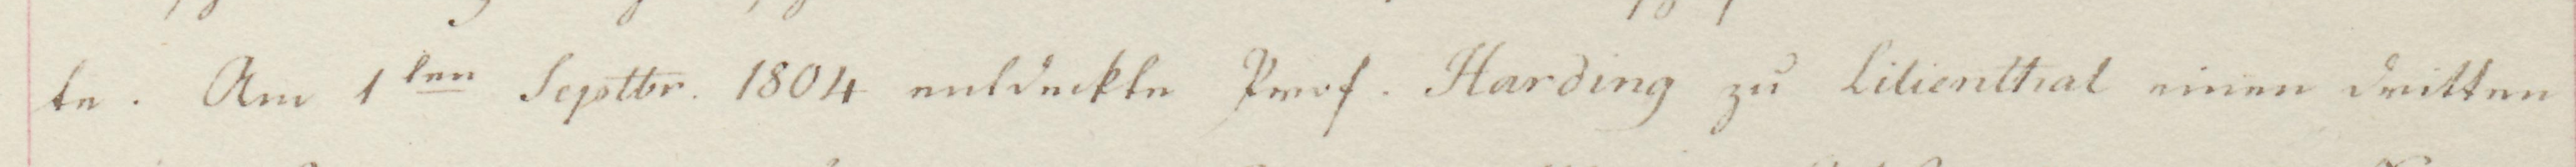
te. Am 1ten Septbr. 1804 entdeckte Prof. Harding zu Lilienthal einen dritten
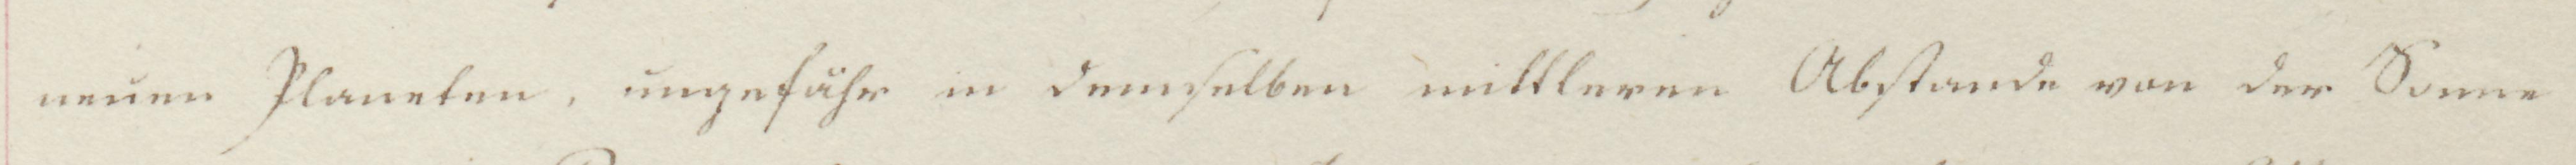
neuen Planeten, ungefähr in demselben mittleren Abstande von der Sonne
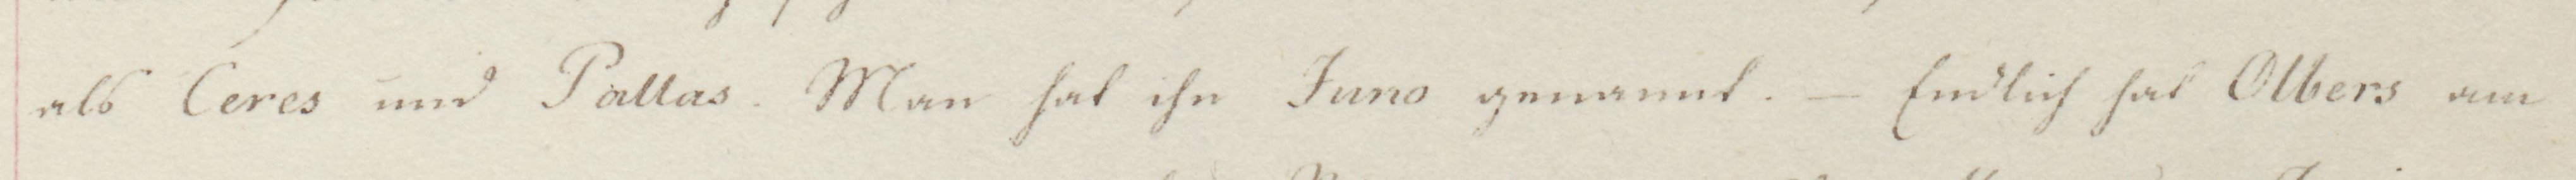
als Ceres und Pallas. Man hat ihn Juno genannt. – Endlich hat Olbers am
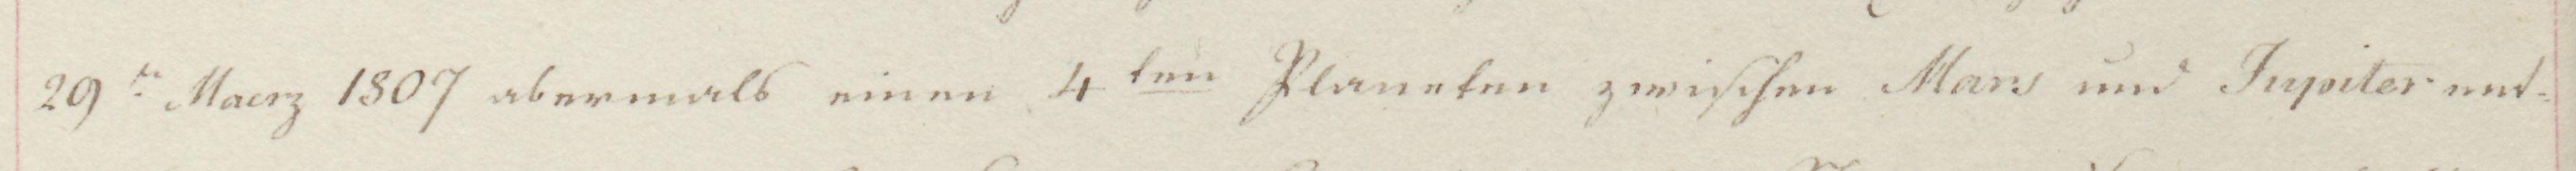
29￼ Maerz 1807 abermals einen 4ten Planeten zwischen Mars und Jupiter ent-
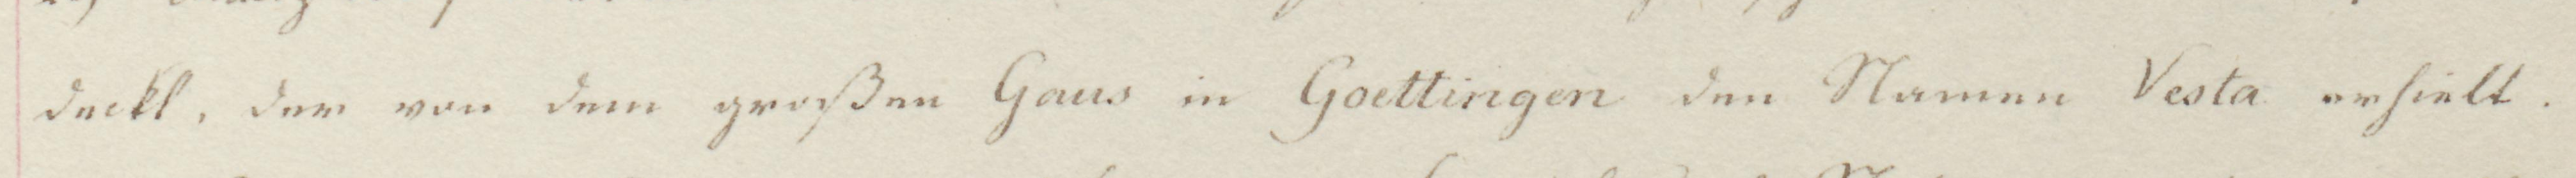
deckt, der von dem großen Gaus in Goettingen den Namen Vesta erhielt.
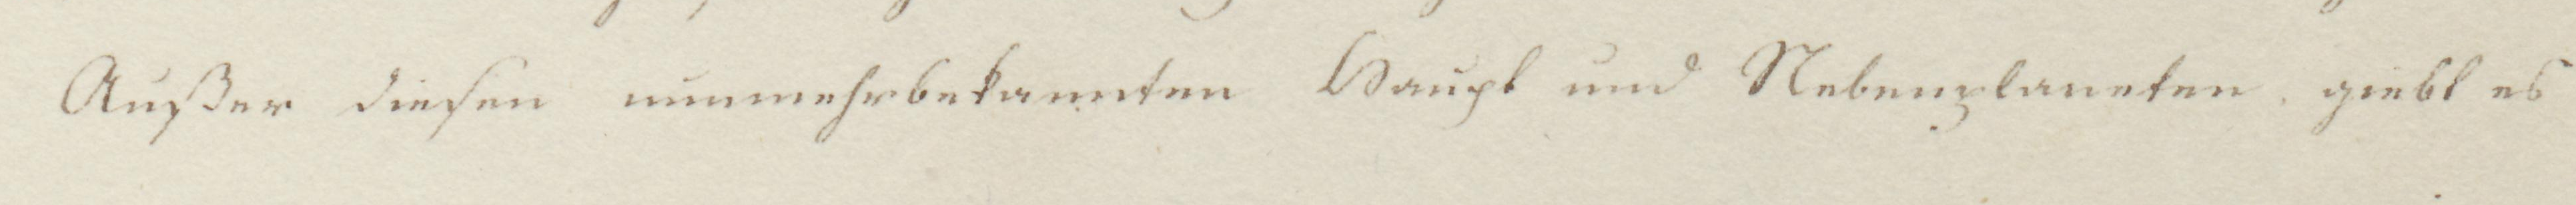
Außer diesen nunmehr bekannten Haupt und Nebenplaneten giebt es
